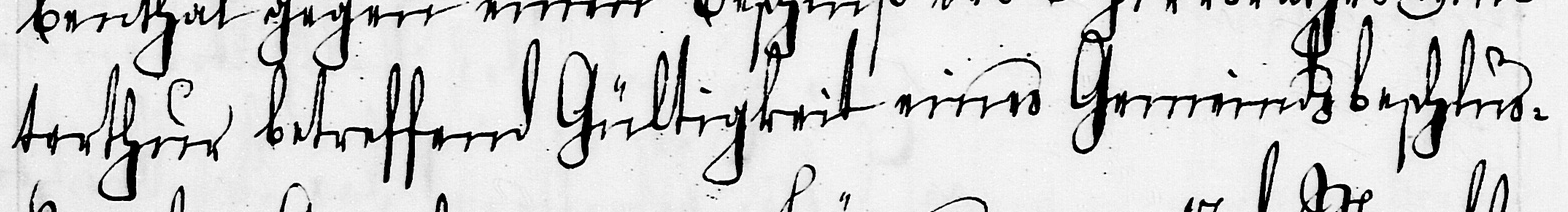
terthur betreffend Gültigkeit eines Gemeindsbeschluß¬
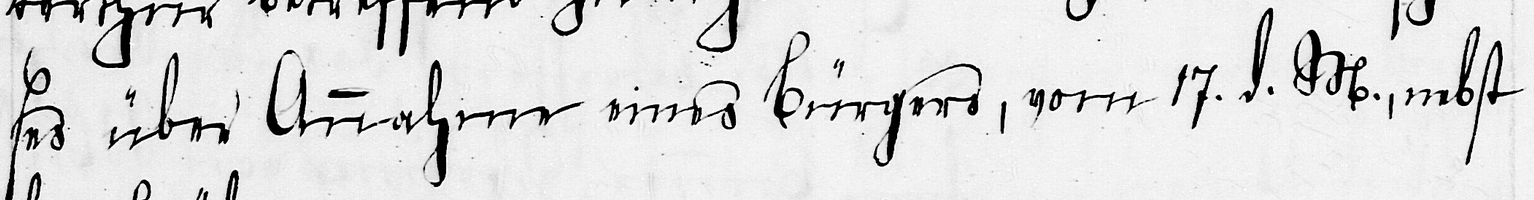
es über Annahme eines Bürgers, vom 17. d. M., nebst
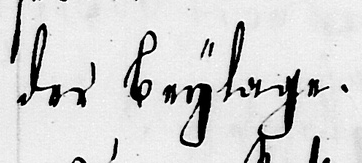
der Beylage.
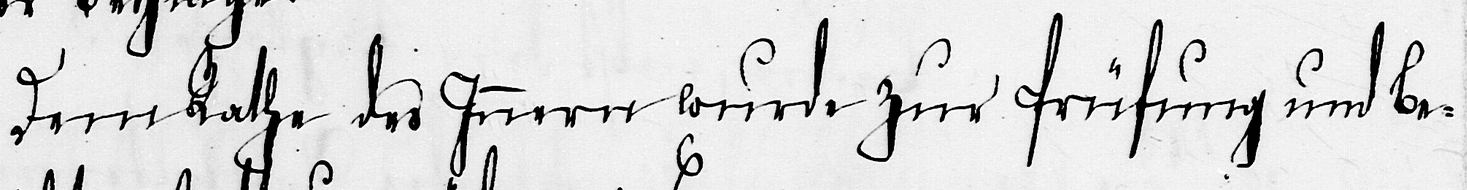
Dem Rathe des Innern wurde zur Prüfung und Be¬
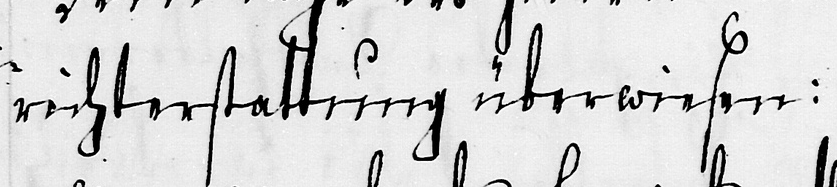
richterstattung überwiesen:
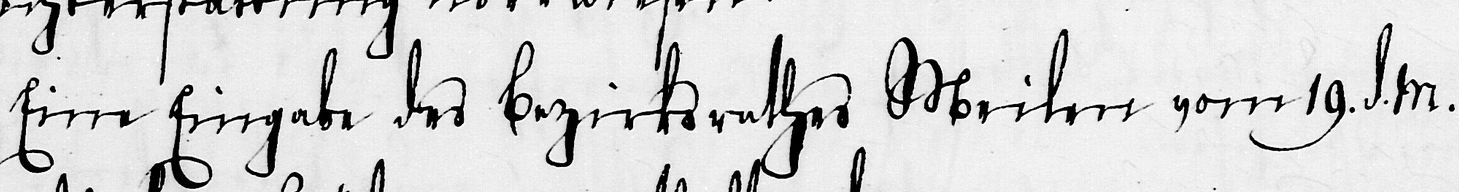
Eine Eingabe des Bezirksrathes Meilen vom 19. d. M.
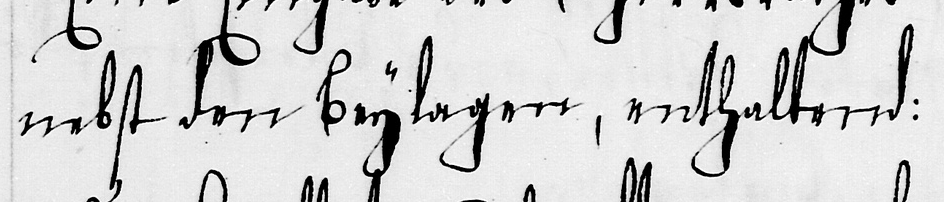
nebst den Beylagen, enthaltend:
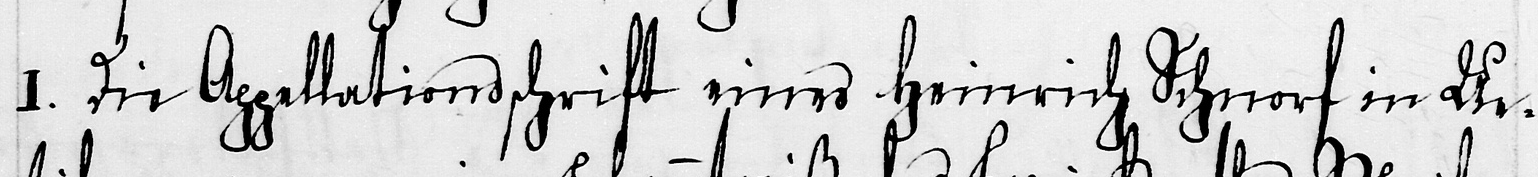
I. Die Appellationsschrift eines Heinrich Schnorf in Ue¬
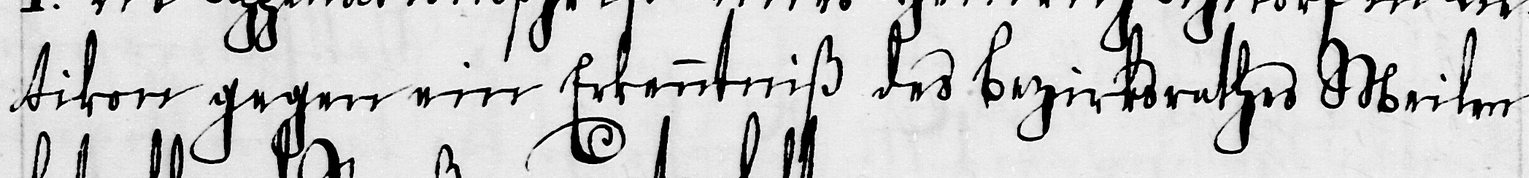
tikon gegen ein Erkenntniß des Bezirksrathes Meilen
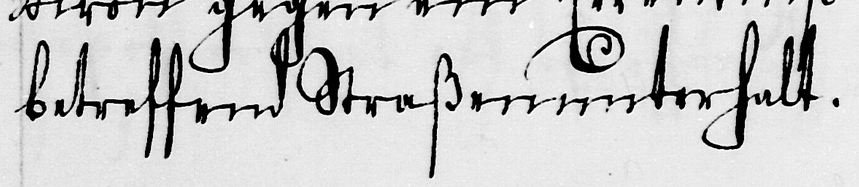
betreffend Straßenunterhalt.
